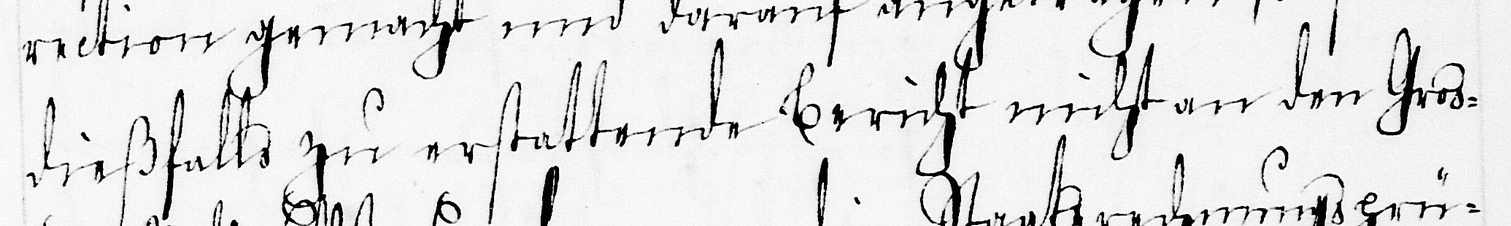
dießfalls zu erstattende Bericht nicht an den Groß¬
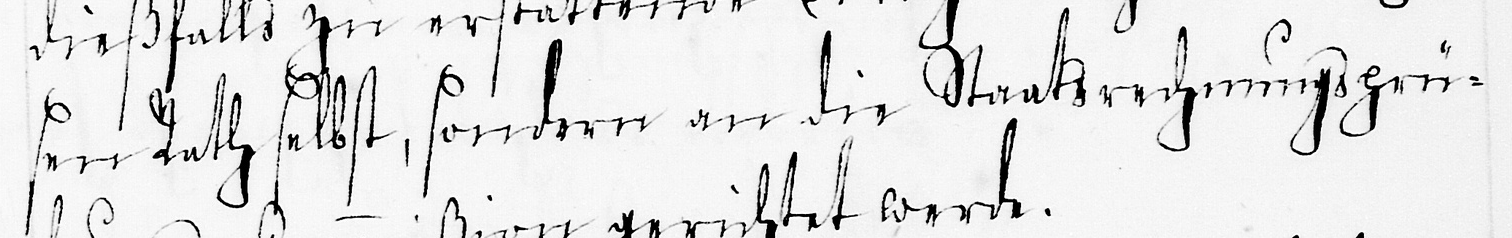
en Rath selbst, sondern an die Staatsrechnungsprü¬
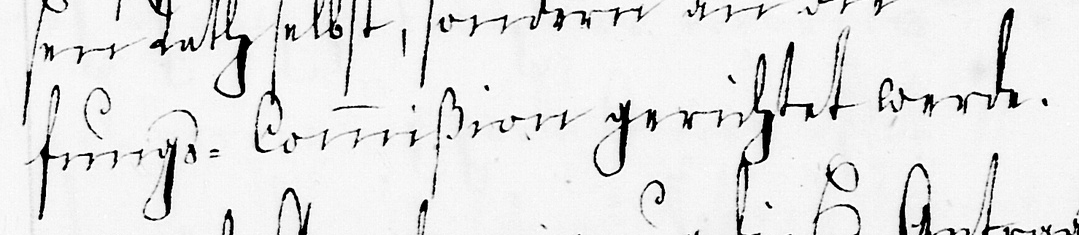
fungs-Commißion gerichtet werde.
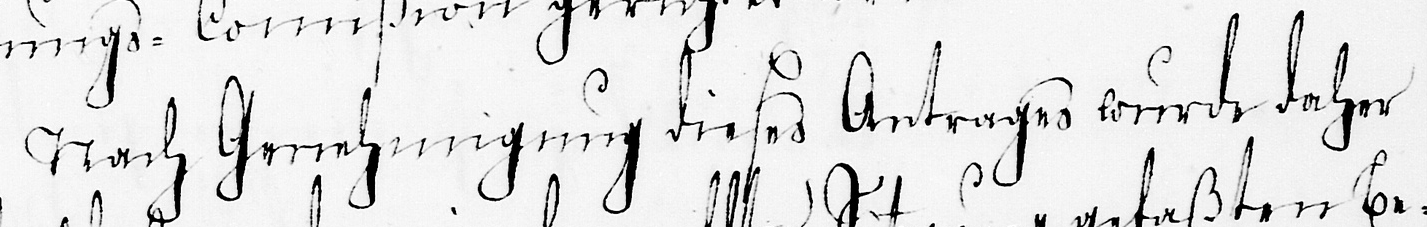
Nach Genehmigung dieses Antrages wurde daher
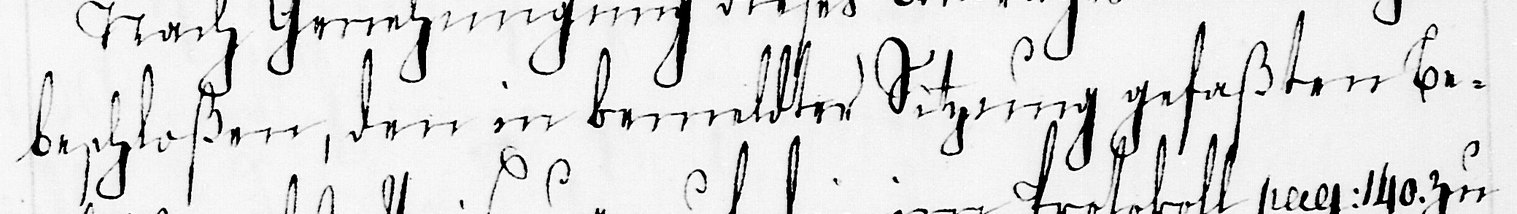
beschloßen, den in bemeldter Sitzung gefaßten Be¬
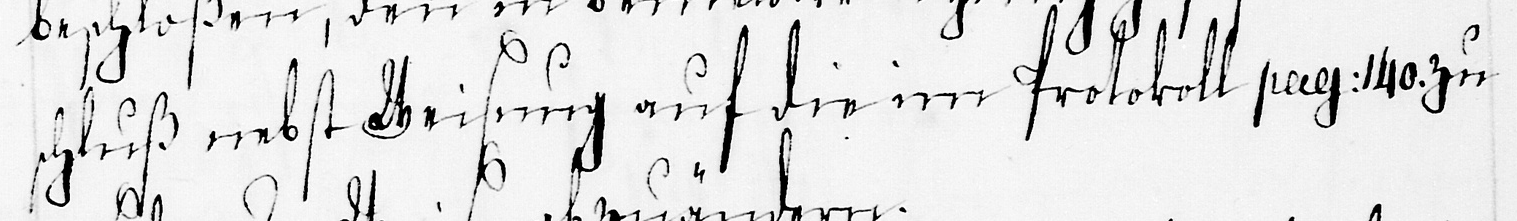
schluß nebst Weisung auf die im Protokoll pag: 140. zu
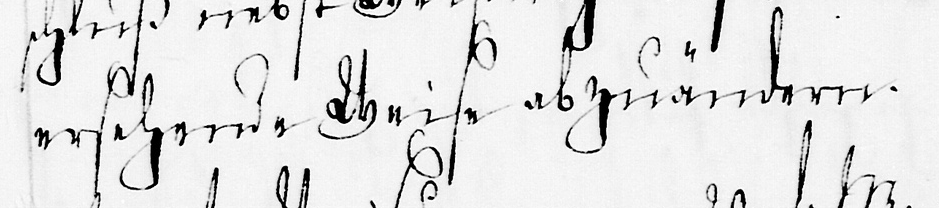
ersehende Weise abzuändern.
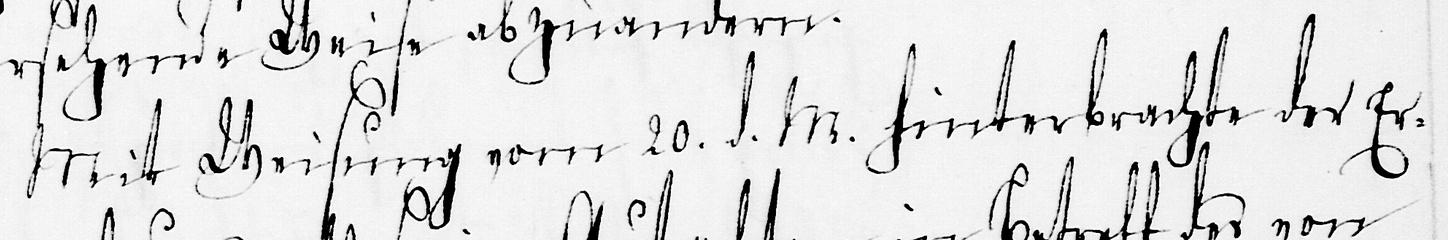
Mit Weisung vom 20. d. M. hinterbrachte der Er¬
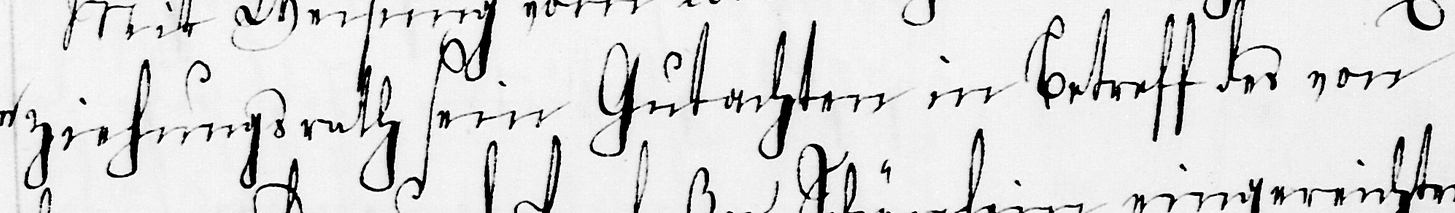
ziehungsrath sein Gutachten in Betreff des von
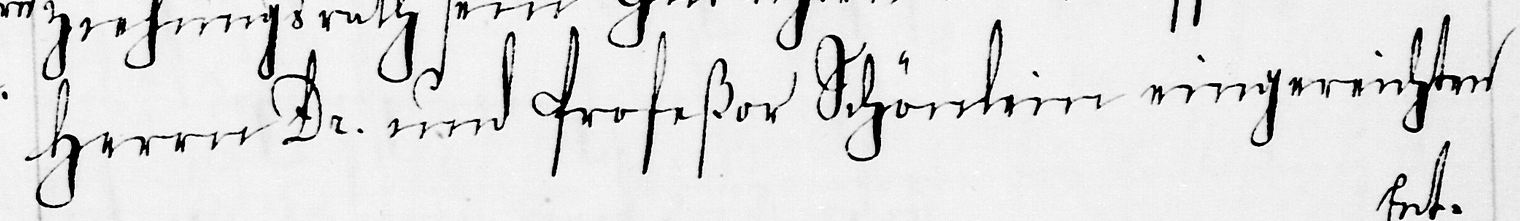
Herrn Dr. und Profeßor Schönlein eingereichten
